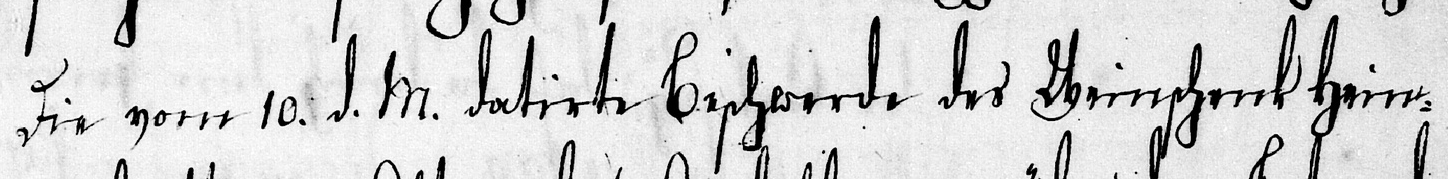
Die vom 10. d. M. datirte Beschwerde des Weinschenk Hein¬
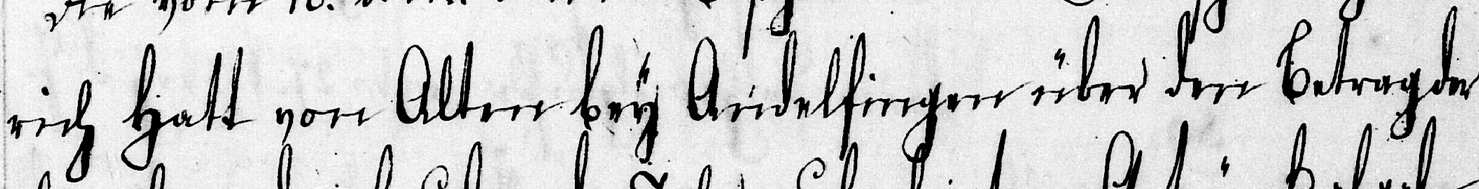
rich Hatt von Alten bey Andelfingen über den Betrag der
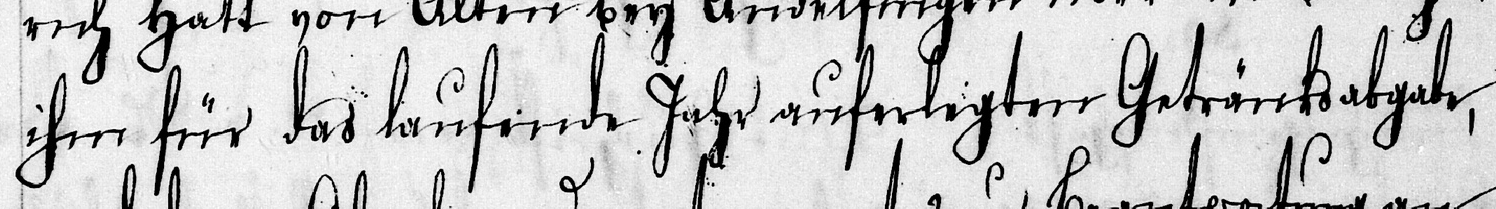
ihm für das laufende Jahr auferlegten Getränksabgabe,
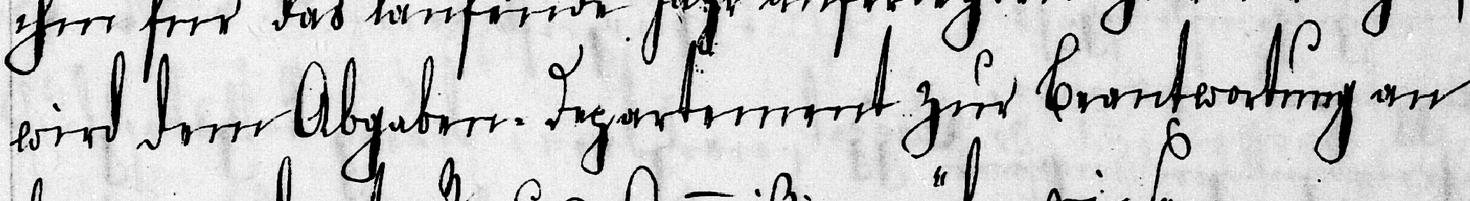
wird dem Abgaben-Departement zur Beantwortung an
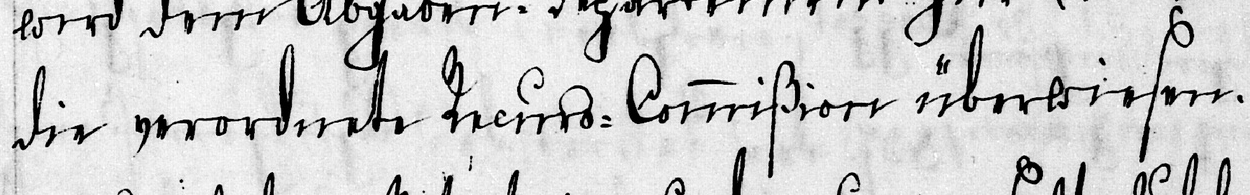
die verordnete Recurs-Commißion überwiesen.
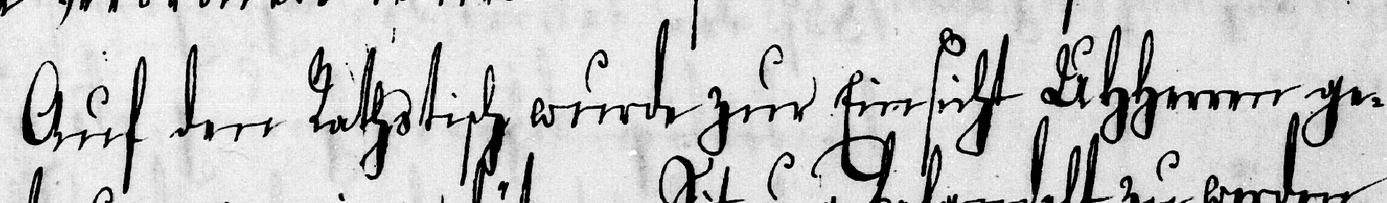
Auf den Rathstisch wurde zur Einsicht UHHerrn ge¬
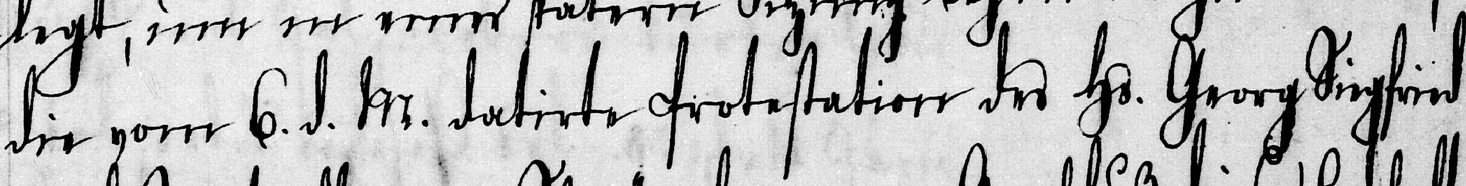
die vom 6. d. M. datirte Protestation des Hs. Georg Siegfri¬
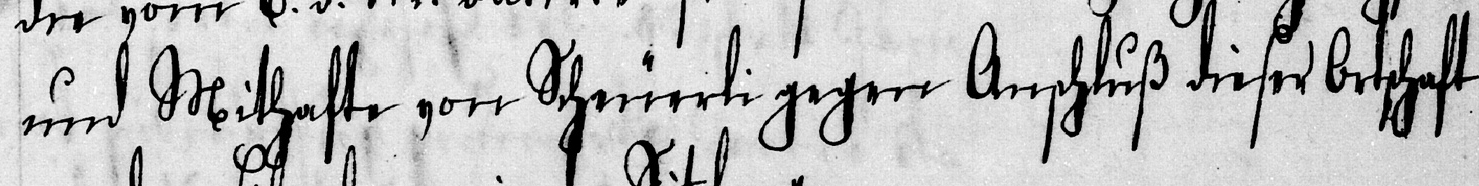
und Mithafte von Scheuerli gegen Anschluß dieser Ortscha¬
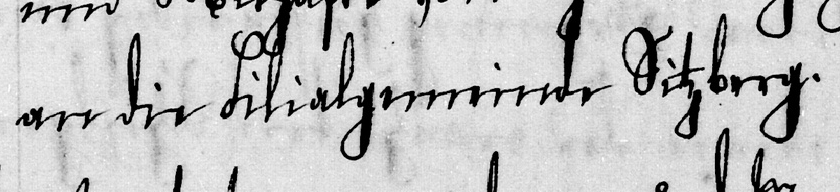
an die Filialgemeinde Sitzberg.
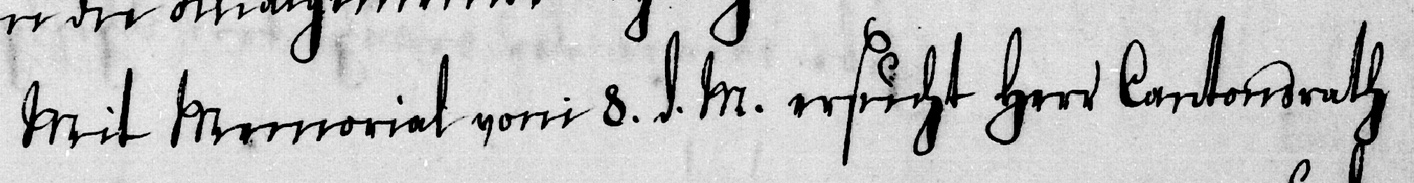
Mit Memorial vom 8. d. M. ersucht Herr Cantonsrath
